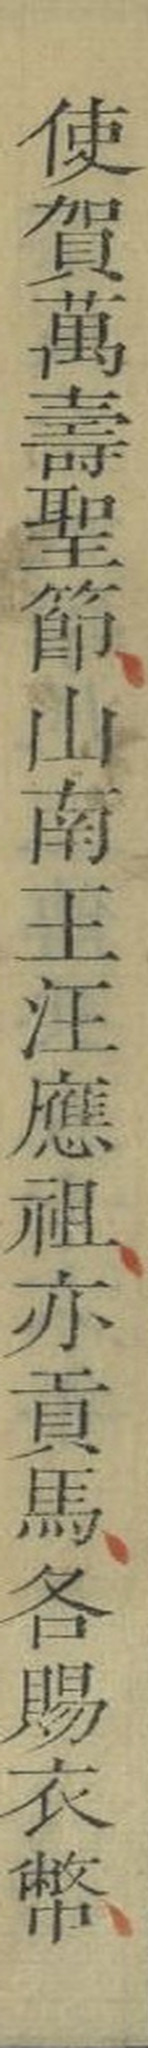使賀万寿聖節山南王汪応祖亦貢馬各賜衣幣
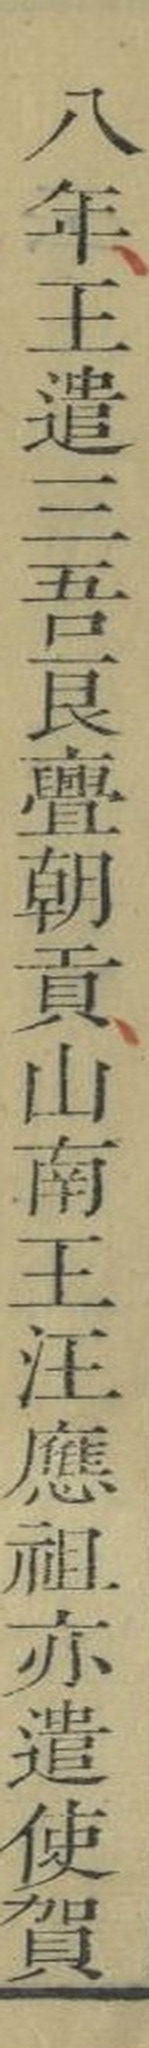八年王遣三吾良亹朝貢山南王汪応祖亦遣使賀
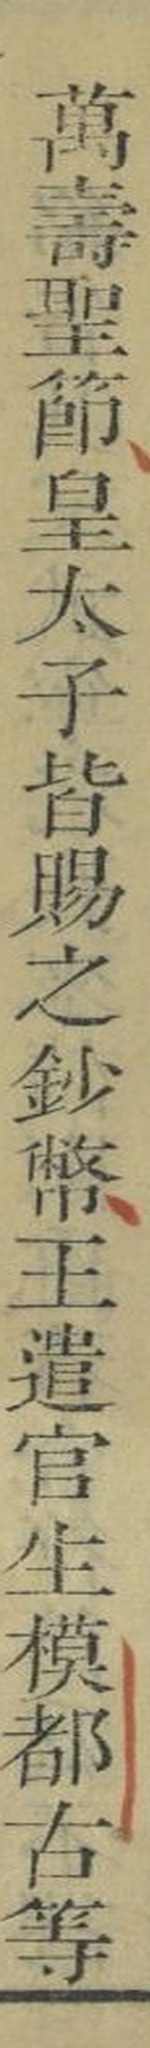万寿聖節皇太子皆賜之鈔幣王遣官生模都古等
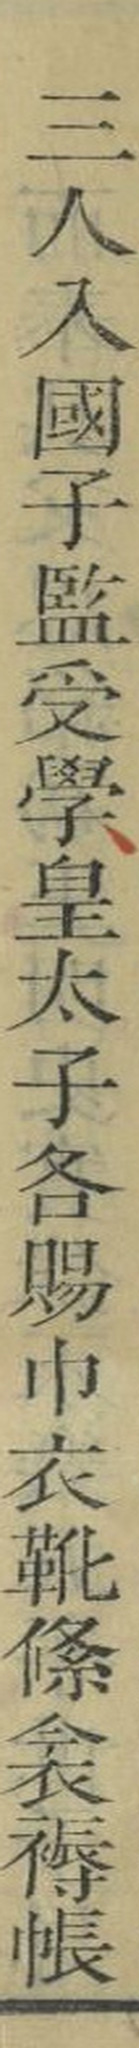三人入国子監受学皇太子各賜巾衣靴絛衾褥帳
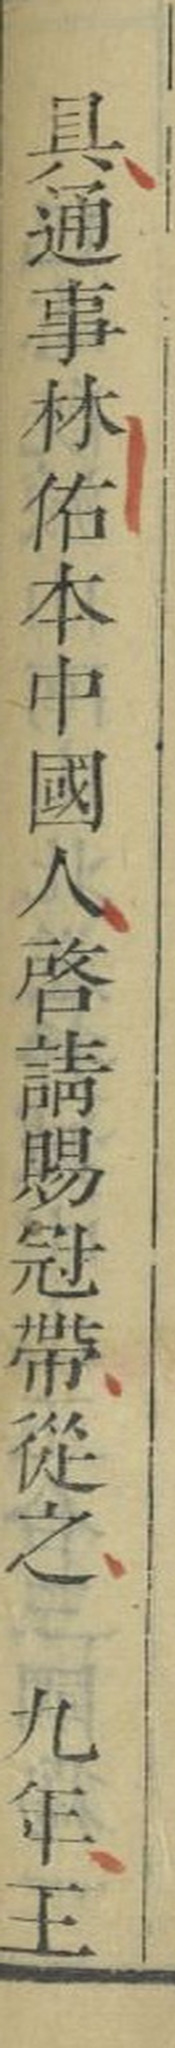具通事林佑本中国人啓請賜冠帯従之九年王
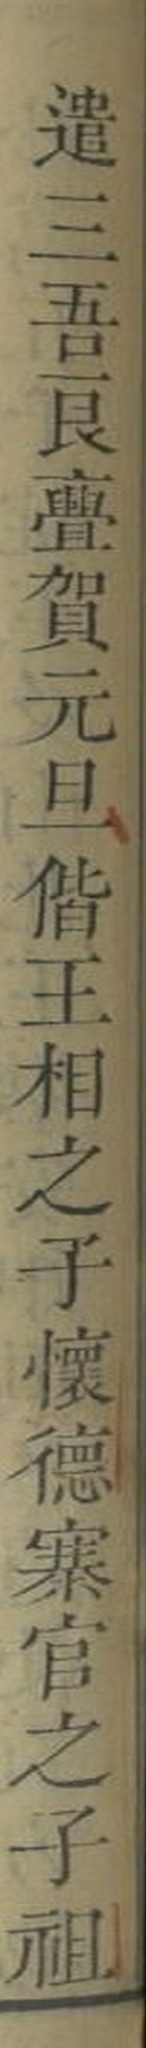遣三吾良亹賀元旦偕王相之子懐徳寨官之子祖
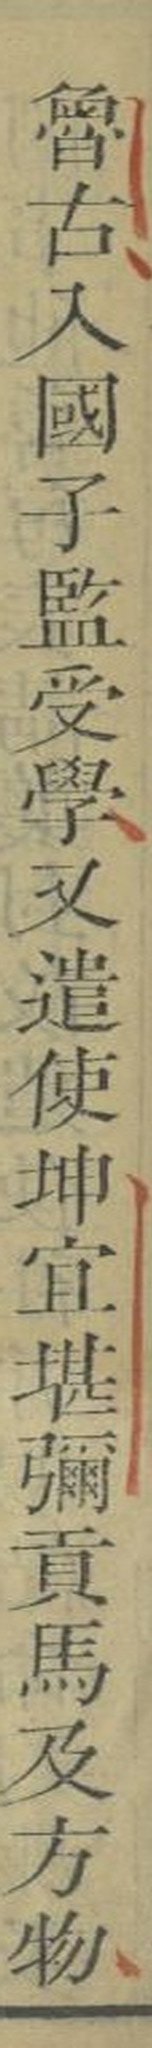魯古入国子監受学又遣使坤宜堪弥貢馬及方物
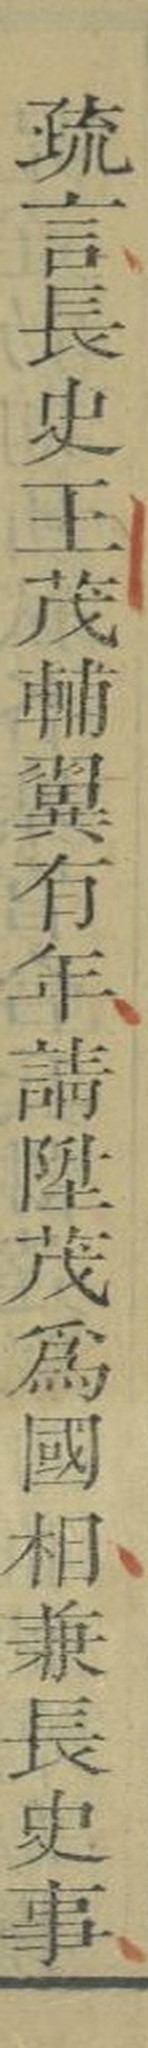疏言長史王茂輔翼有年請陞茂為国相兼長史事
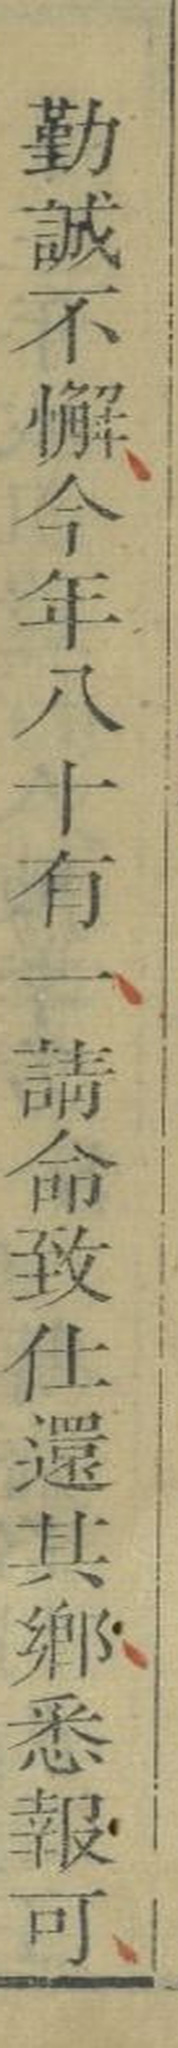勤誠不懈今年八十有一請命致仕還其郷悉報可
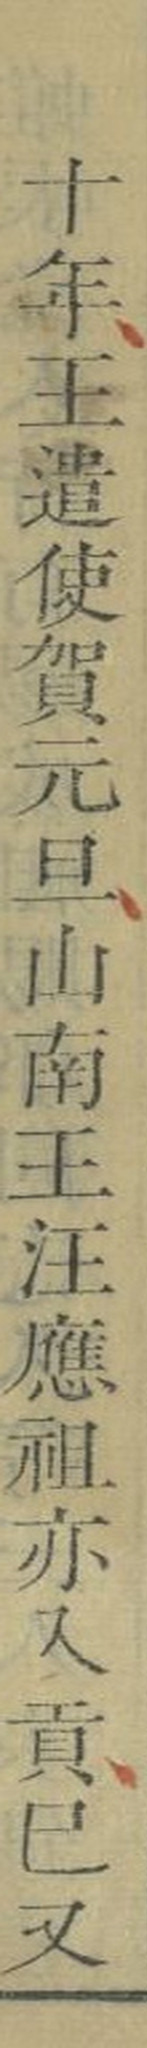十年王遣使賀元旦山南王汪応祖亦入貢巳又
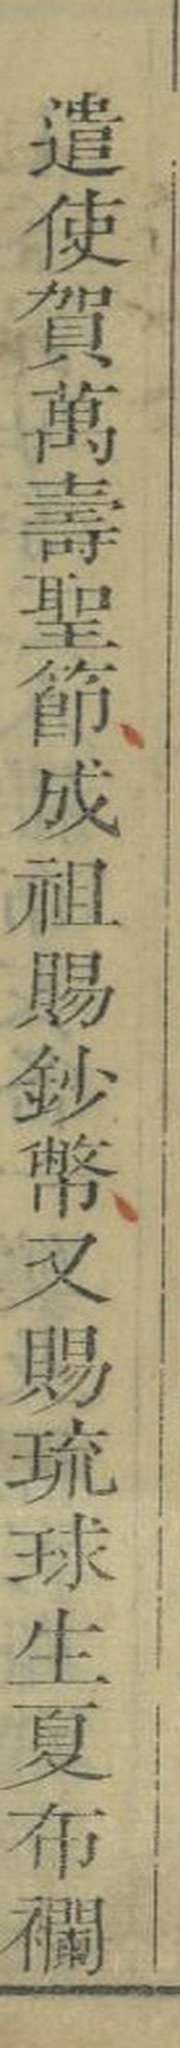遣使賀万寿聖節成祖賜鈔幣又賜琉球生夏布襴
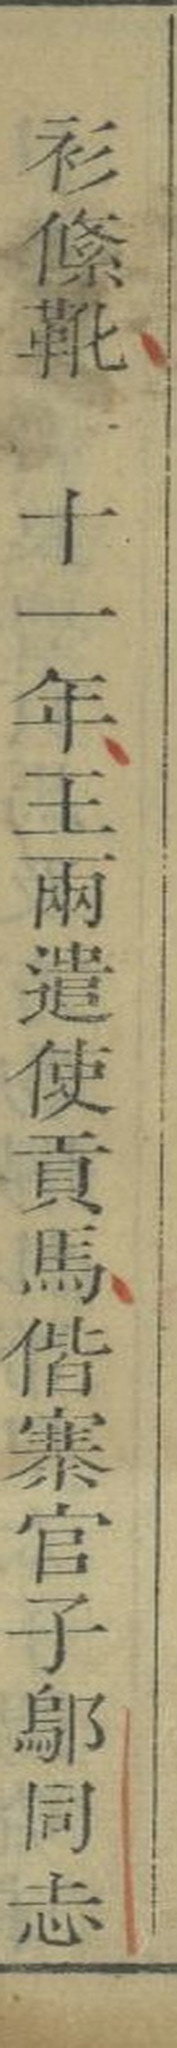衫絛靴十一年王両遣使貢馬偕寨官子鄔同志

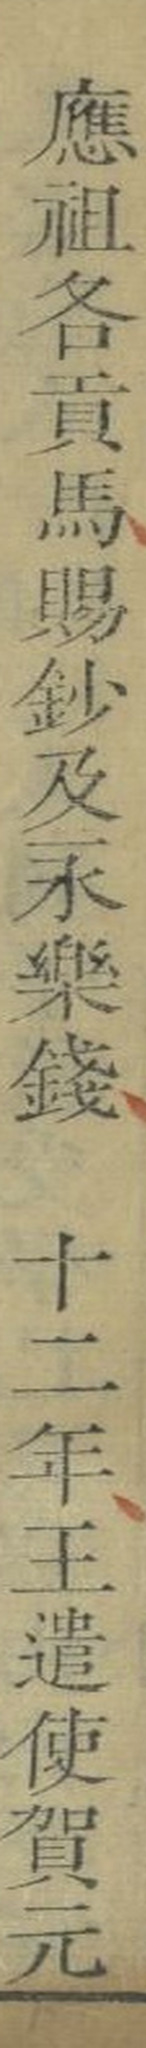応祖各貢馬賜鈔及永楽銭十二年王遣使賀元
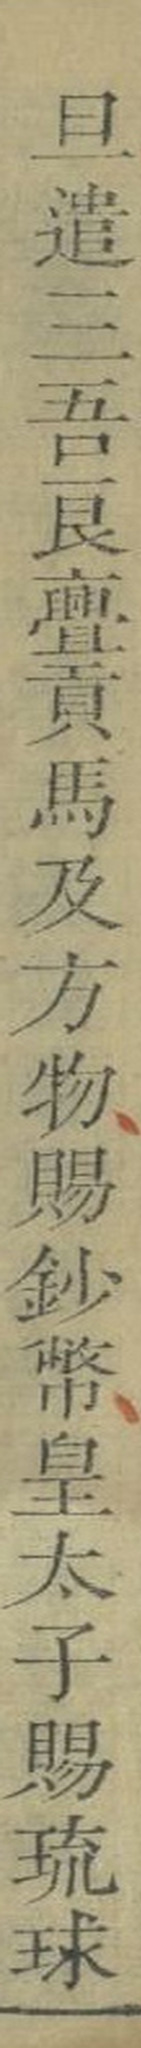旦遣三吾良亹貢馬及方物賜鈔幣皇太子賜琉球
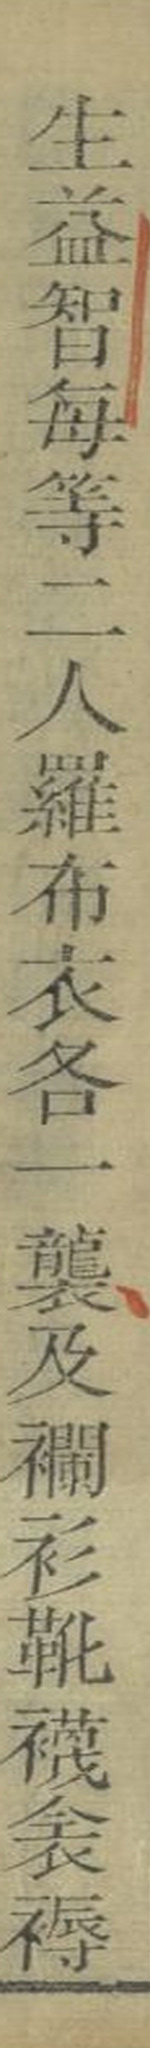生益智毎等二人羅布衣各一襲及襴衫靴襪衾褥
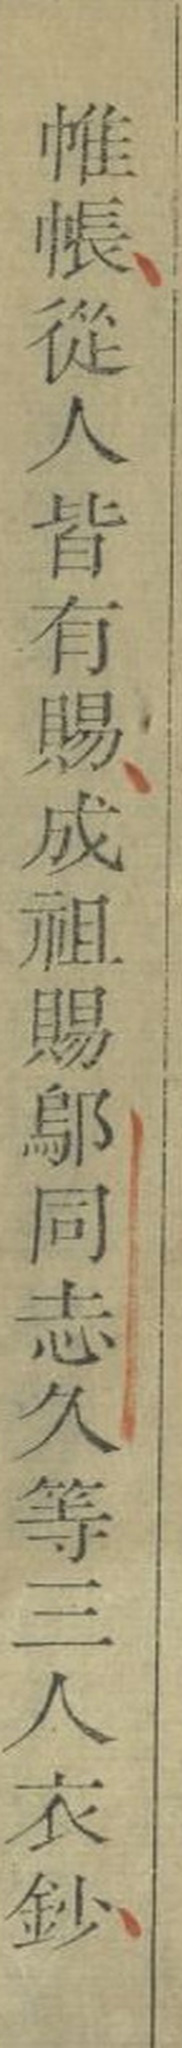帷帳従人皆有賜成祖賜鄔同志久等三人衣鈔
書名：中山伝信録 巻三
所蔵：University of the Ryukyus Library
